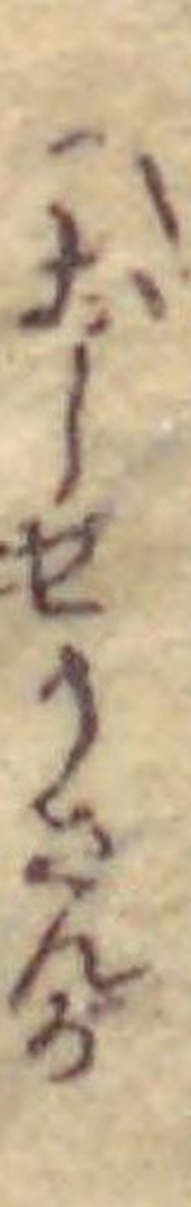〽おしせうさんが
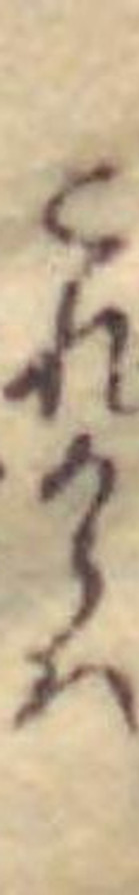これからは
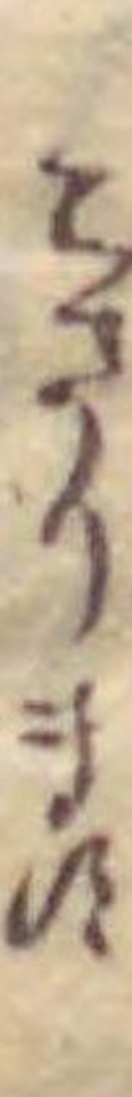こさります
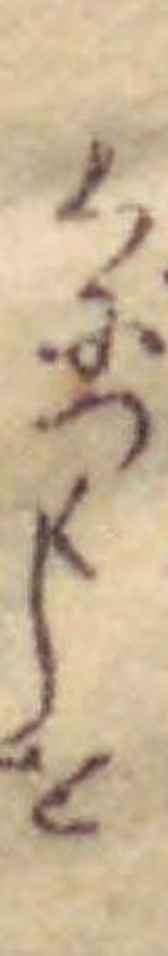くにつくしを
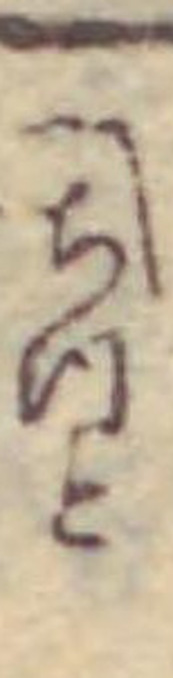〽ちつと
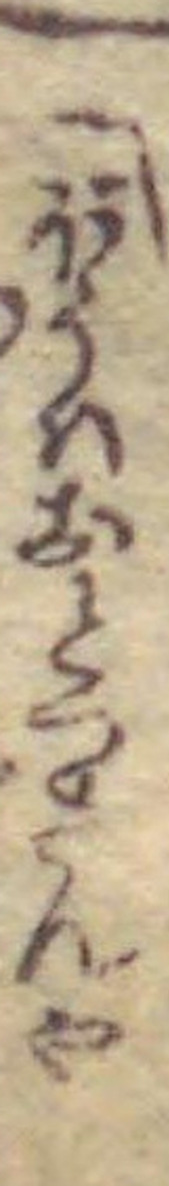〽ぼうはおとつさんや
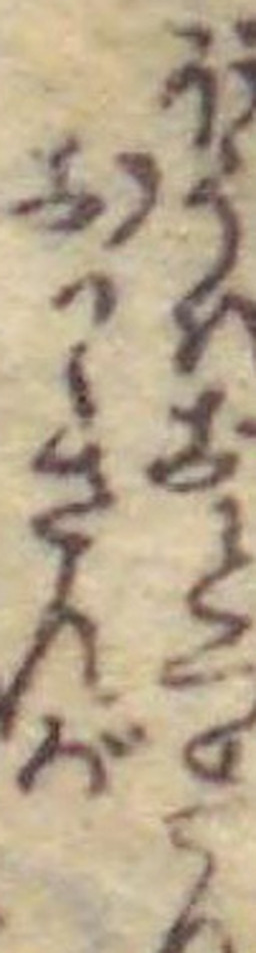おかゝさんが
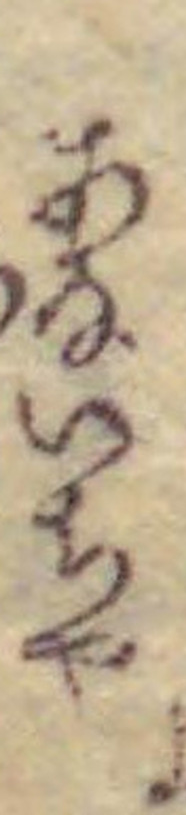あないちや
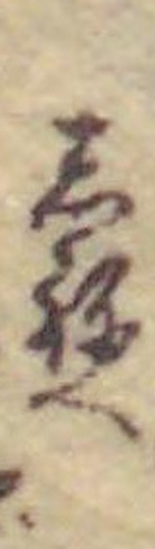しねへ

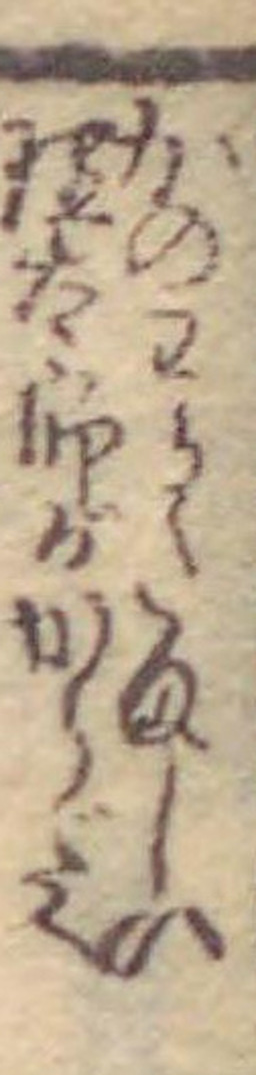理太郎がからだへ
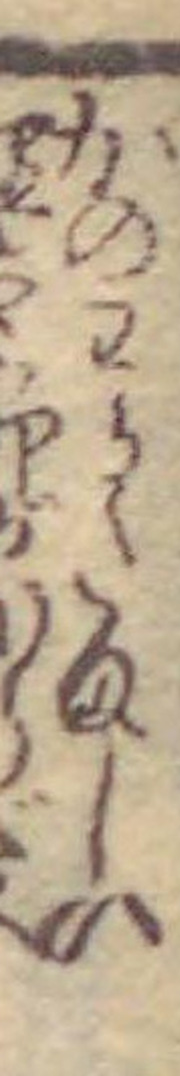かのわるたましい
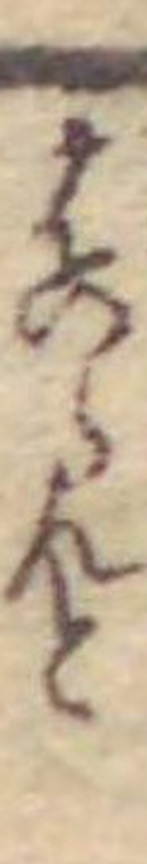はいらんと
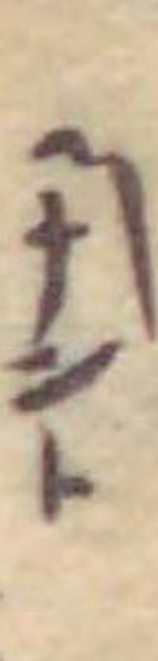〽ナント
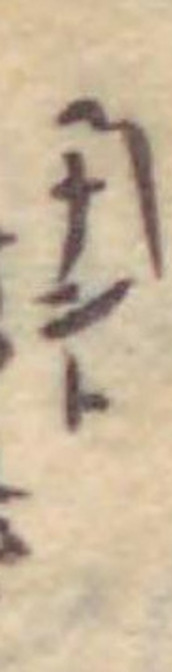〽ナント
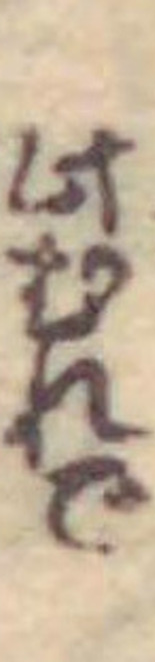此むれで
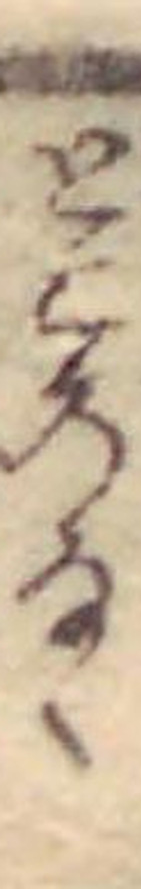ところなく
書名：心学早染艸 : 3巻
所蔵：国立国会図書館 National Diet Library, JAPAN
